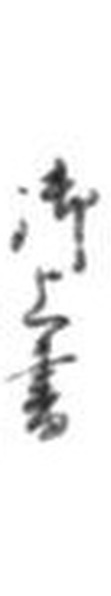御上書
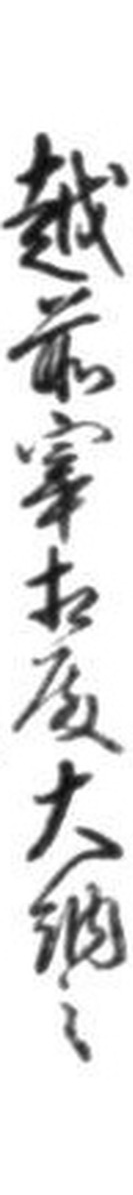越前宰相殿大納言
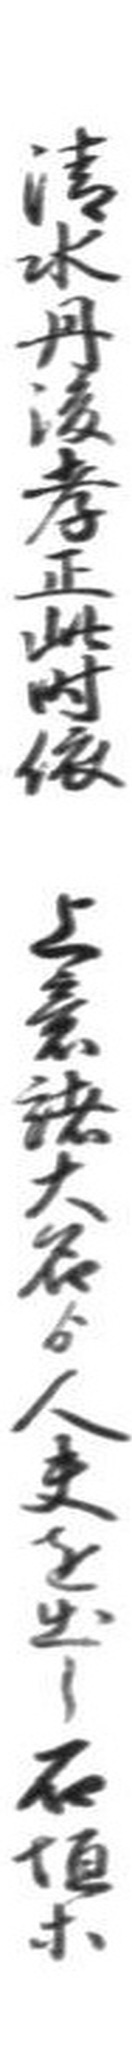清水丹後孝正此時依上意諸大名ゟ人夫を出し石垣等
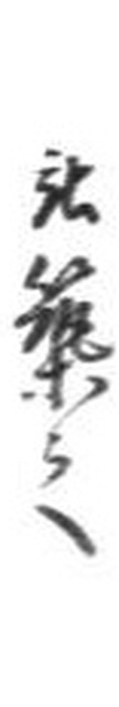被築之
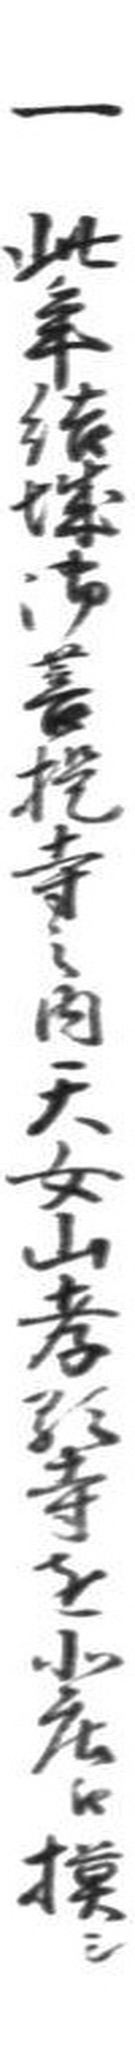一此年結城御菩提寺之内天女山孝顕寺を北庄江摸シ
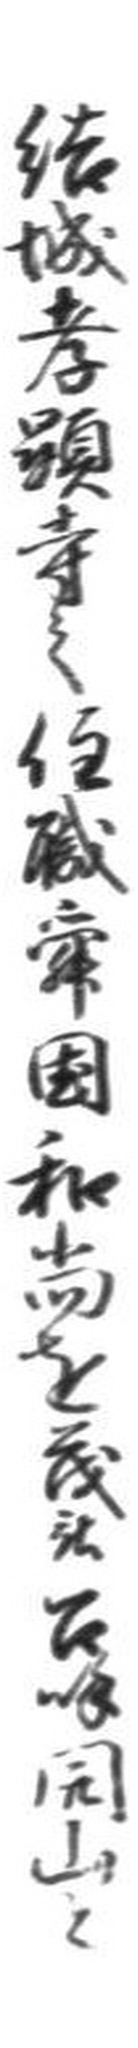結城孝顕寺之住職舜国和尚を茂被召呼開山と

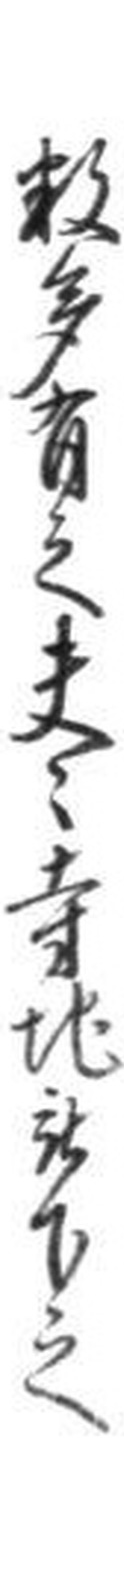数多有之夫々寺地被下之
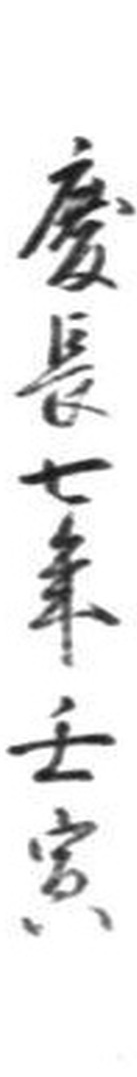慶長七年壬寅
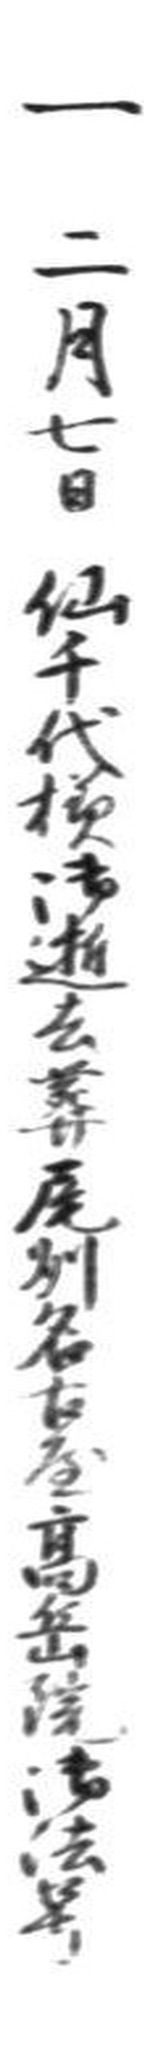一二月七日仙千代様御逝去葬尾州名古屋高岳院御法号
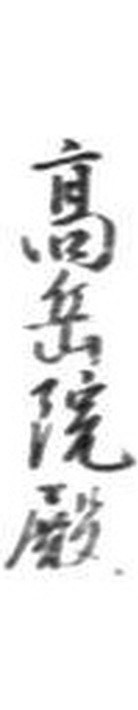高岳院殿
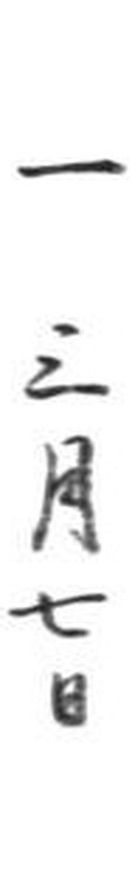一三月七日
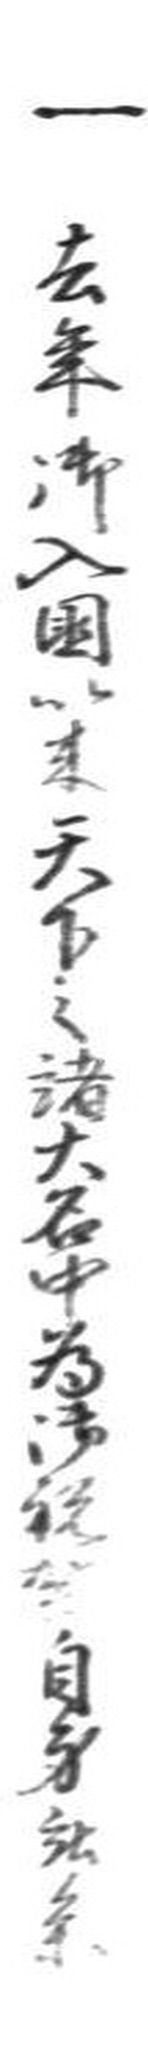一去年御入国以来天下之諸大名中為御祝賀自身被参
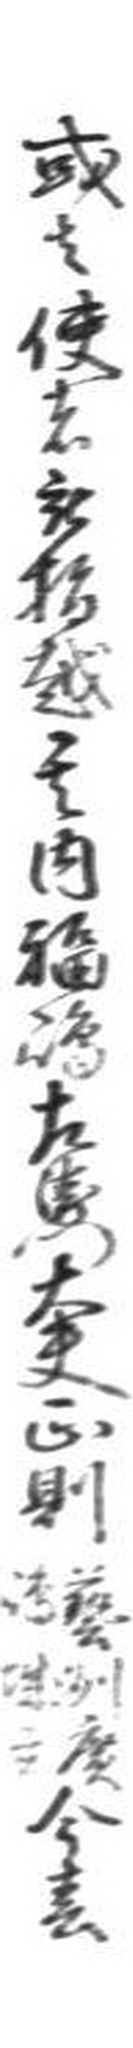或者使者被指越其内福島左衛門大夫正則芸州広島城主今春
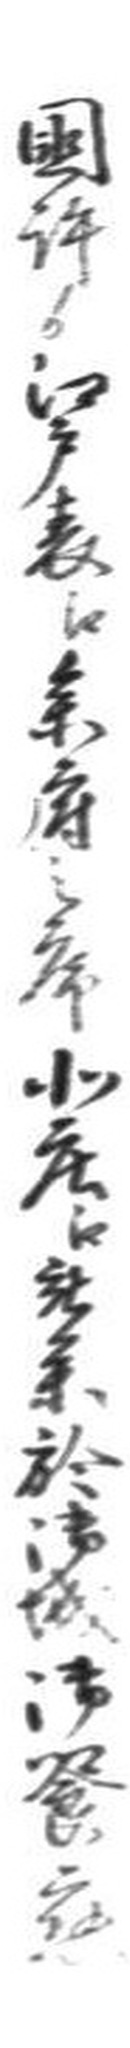国許ゟ江戸表江参府之序北庄江被参於御城御饗応
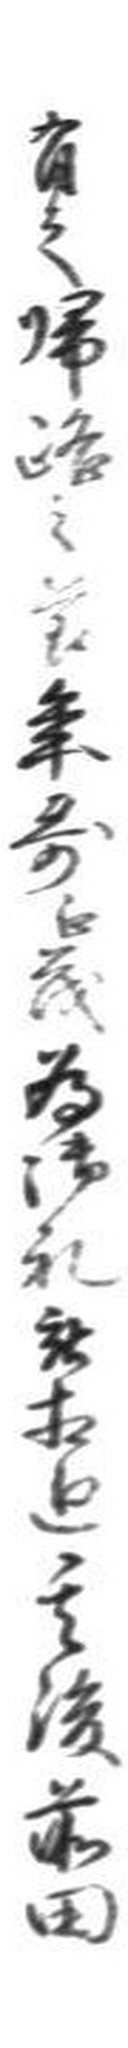有之帰路之節年寄江茂為御礼被相廻其後前田

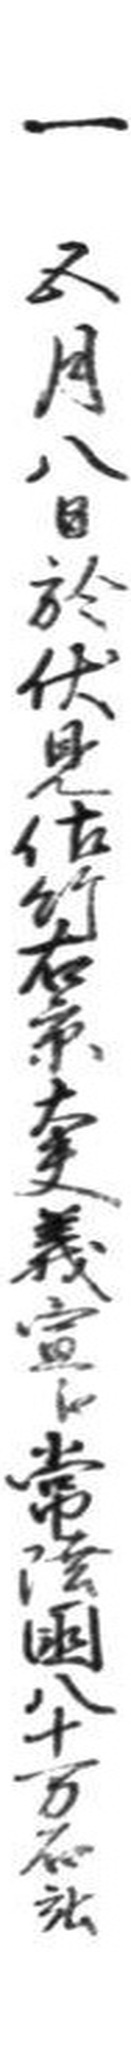一五月八日於伏見佐竹右京大夫義宣江常陸国八十万石被
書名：家譜 一 秀康公 従天正二年到慶長十二年
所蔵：福井県文書館 Fukui Prefectural Archives
